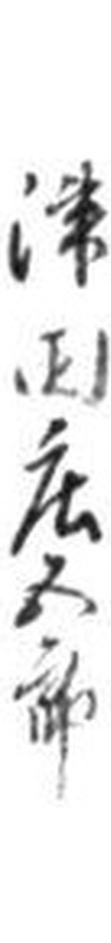津田庄五郎
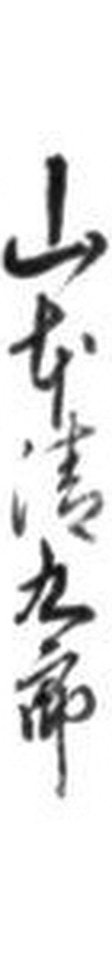山本清九郎
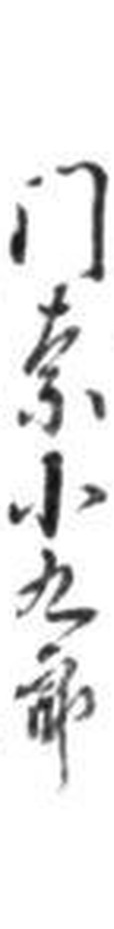門奈小九郎
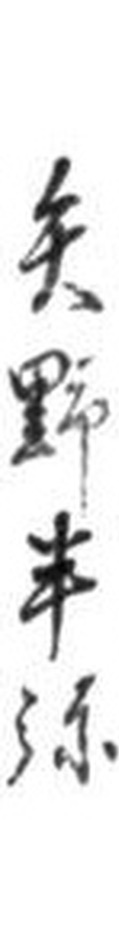矢野半弥
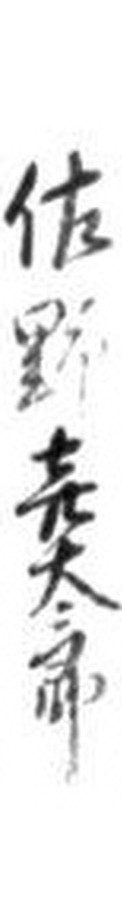佐野喜太郎
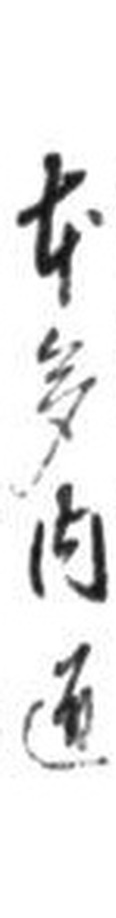本多内匠
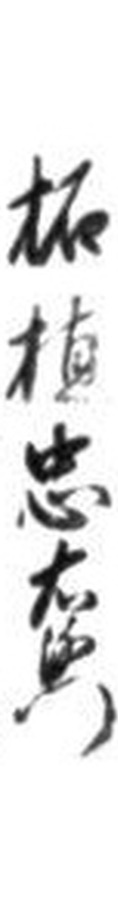柘植忠右衛門
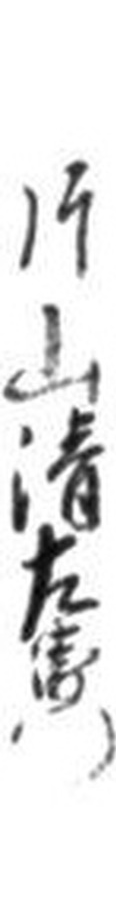片山清左衛門
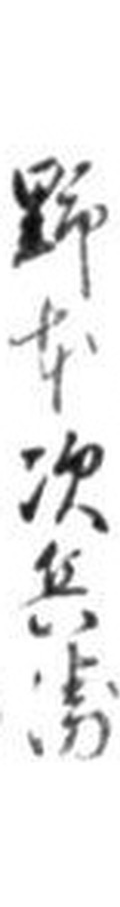野本次兵衛
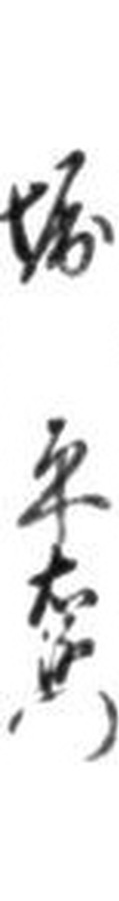堀平右衛門
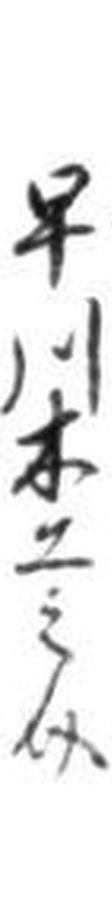早川木工之介
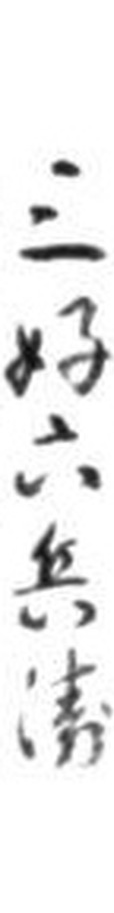三好六兵衛
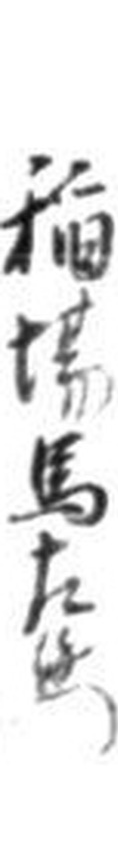稲場馬左衛門
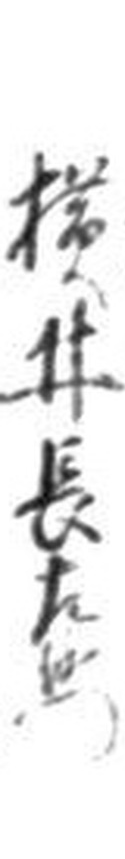横井長左衛門
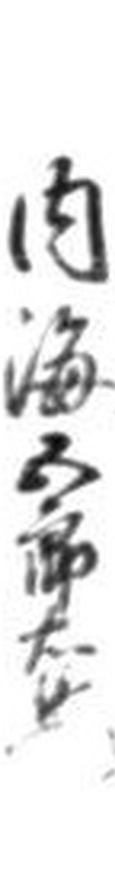内海五郎右衛門
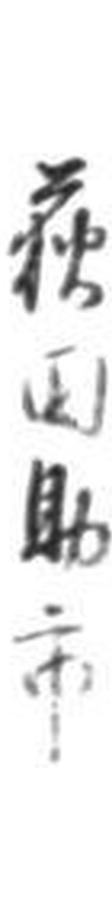荻田助市
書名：家譜 二 忠直公 従文禄四年到慶安四年
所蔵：福井県文書館 Fukui Prefectural Archives
